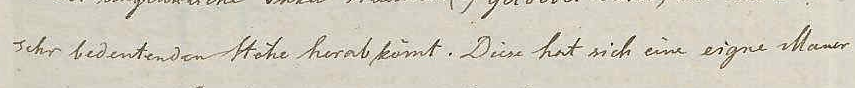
sehr bedeutenden Höhe herab kömt. Diese hat sich eine eigne Mauer
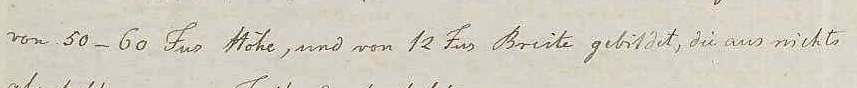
von 50–60 Fus Höhe, und von 12 Fus Breite gebildet, die aus nichts
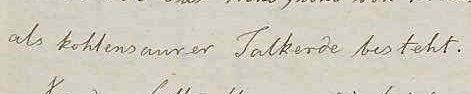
als kohlensaurer Talkerde besteht.
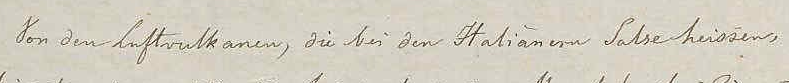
Von den Luftvulkanen, die bei den Italiänern Salse heissen,
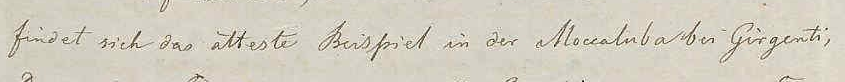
findet sich das älteste Beispiel in der Moccaluba bei Girgenti.
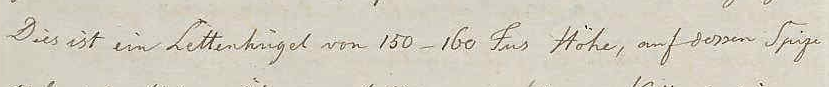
Dies ist ein Lettenhügel von 150–160 Fus Höhe, auf dessen Spize
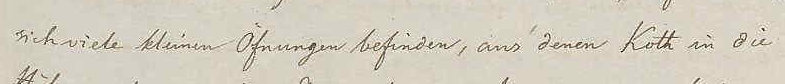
sich viele kleinen Öfnungen befinden, aus denen Koth in die
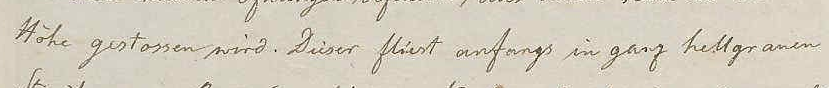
Höhe gestossen wird. Dieser fliest anfangs in ganz hellgrauen
